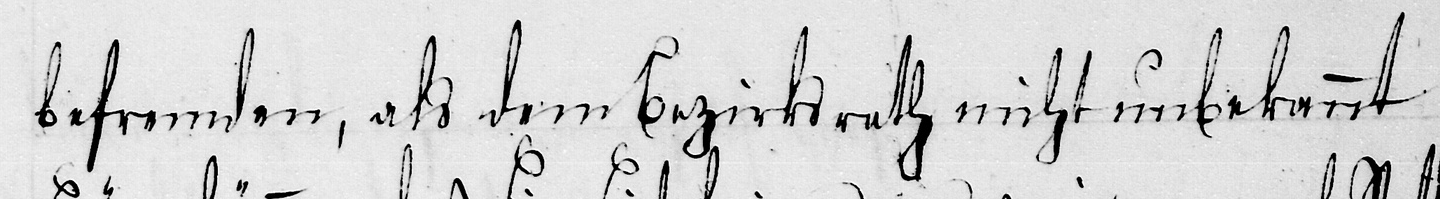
befremden, als dem Bezirksrath nicht unbekannt
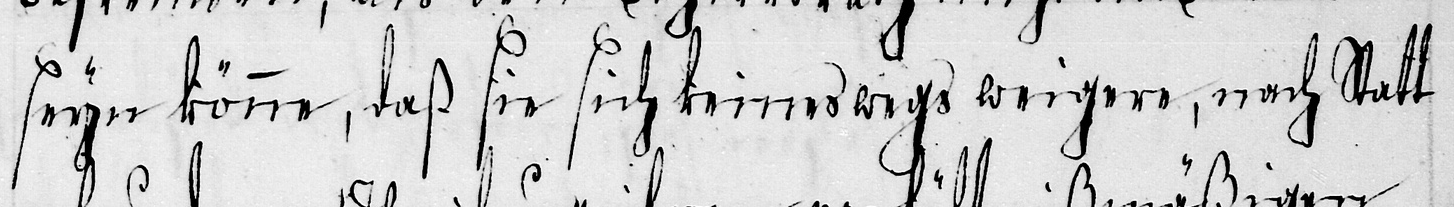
seyn könne, daß sie sich keineswegs weigere, nach Statt
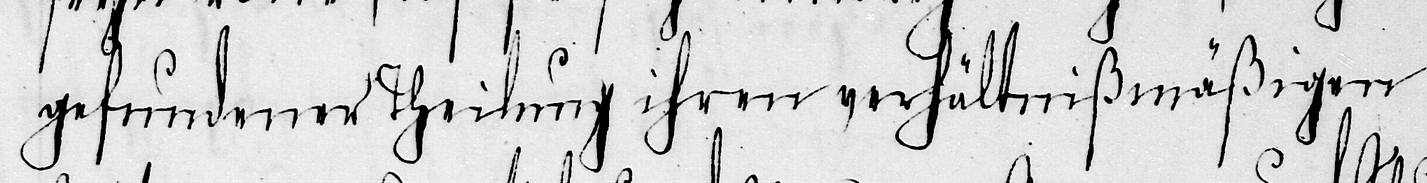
gefundener Theilung ihren verhältnißmäßigen
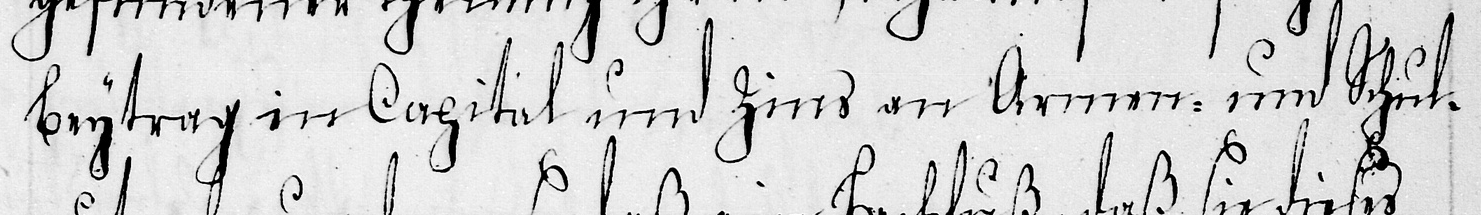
Beytrag in Capital und Zins an Armen- und Schul¬
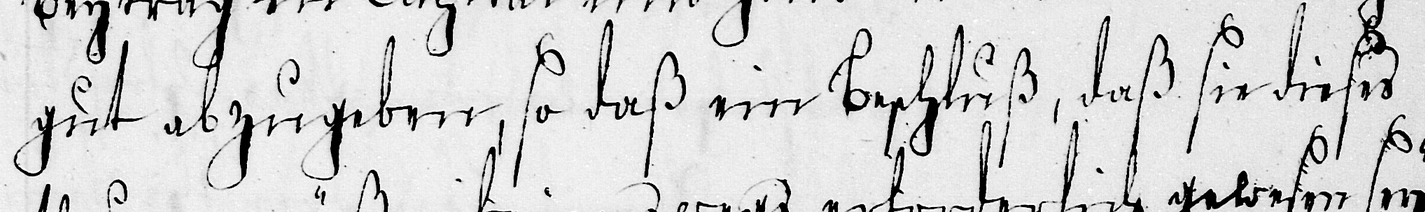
gut abzugeben, so daß ein Beschluß, daß sie dieses
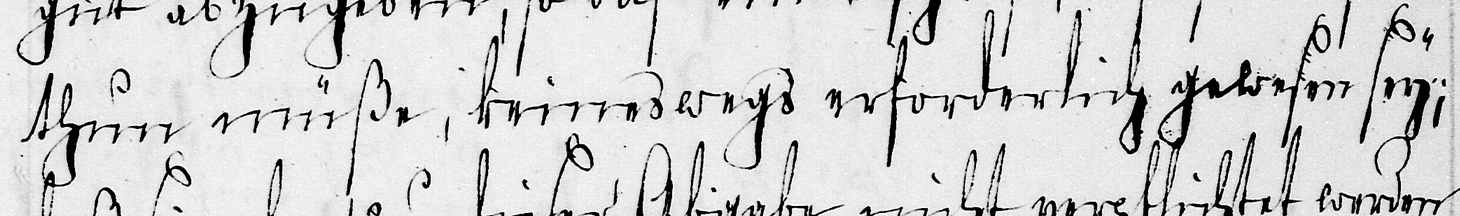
thun müße, keineswegs erforderlich gewesen sey;
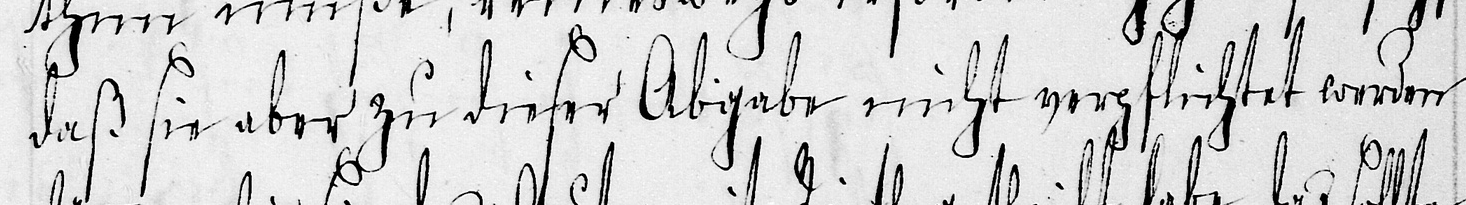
daß sie aber zu dieser Abgabe nicht verpflichtet werden
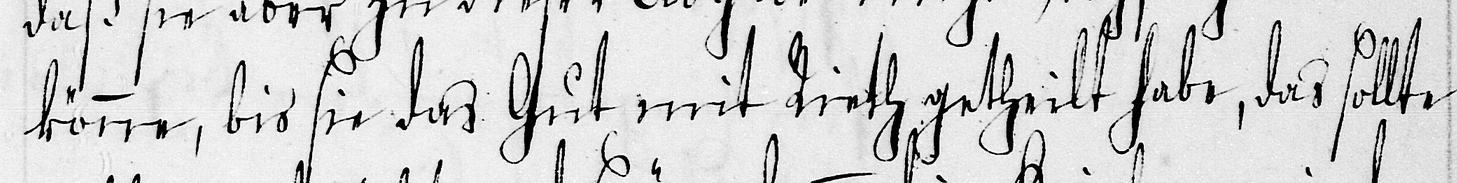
könne, bis sie das Gut mit Rieth getheilt habe, das soll¬
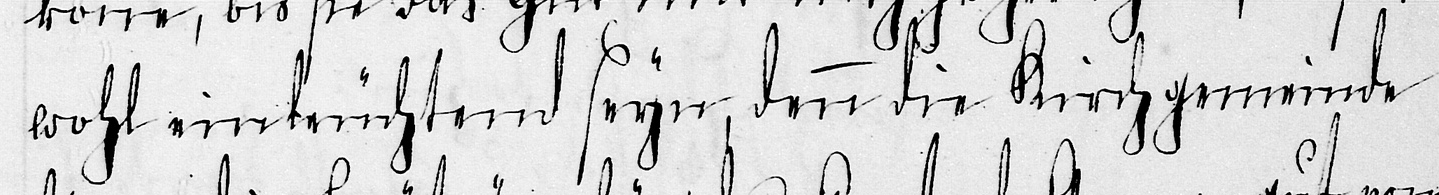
wohl einleuchtend seyn, denn die Kirchgemeinde
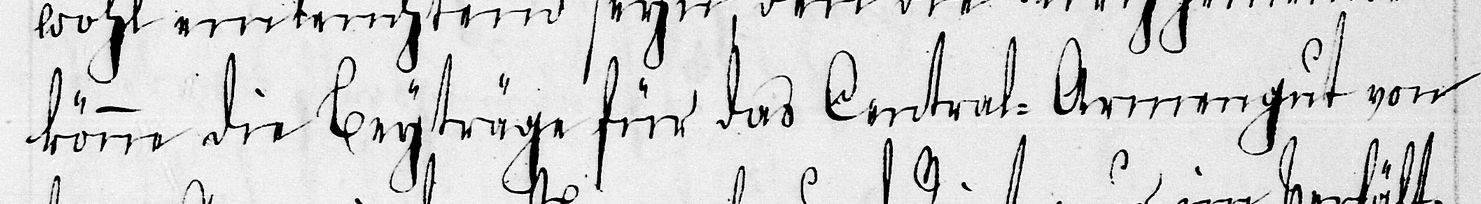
könne die Beyträge für das Central-Armengut von
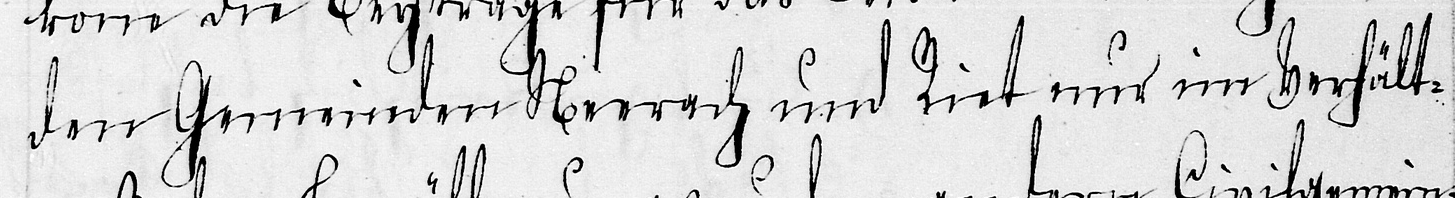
den Gemeinden Neerach und Riet nur im Verhält¬
